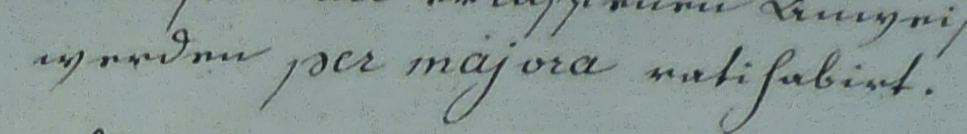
werden per majora ratihabirt.
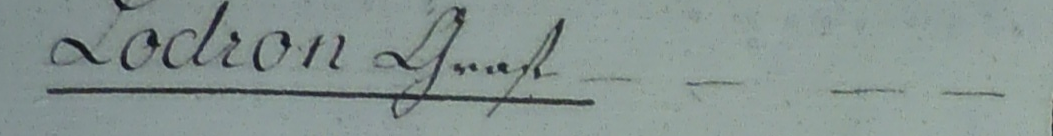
Lodron Graf _ _ _ _
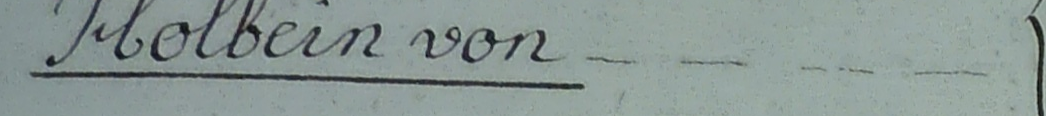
Holbein von _ _ _ _
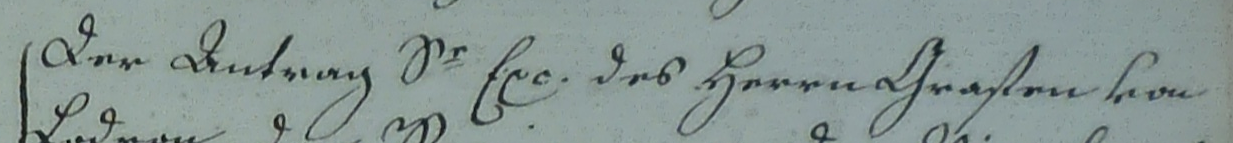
Der Antrag Se͇ Exc. des Herrn Grafen von
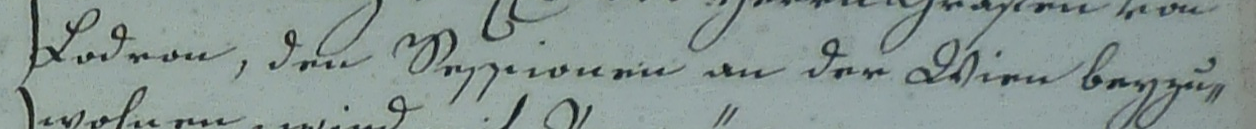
Lodron, den Sessionen an der Wien beyzu¬
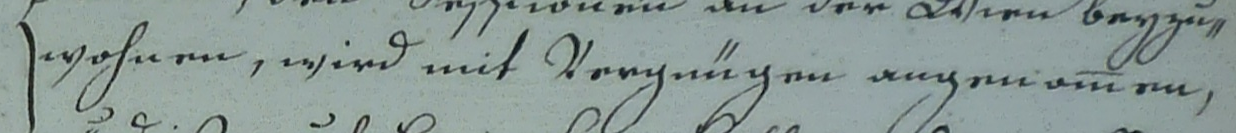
wohnen, wird mit Vergnügen angenom̅en,
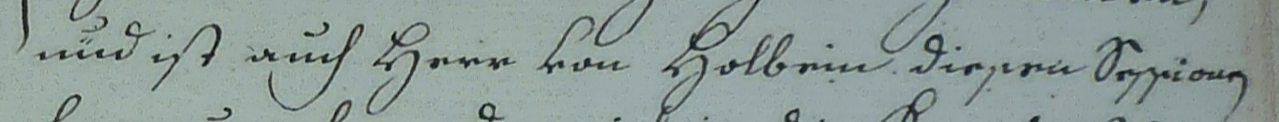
und ist auch Herr von Holbein diesen Sessionen
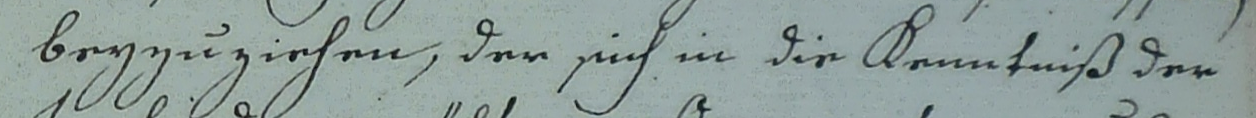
beyzuziehen, der sich in die Kenntniß der
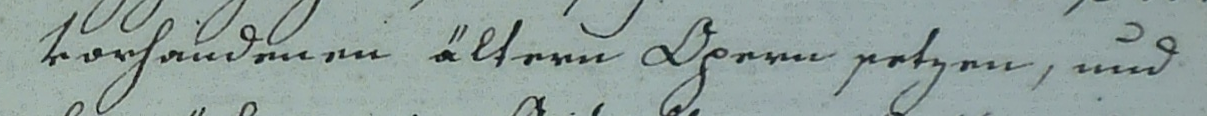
vorhandenen ältern Opern setzen, und
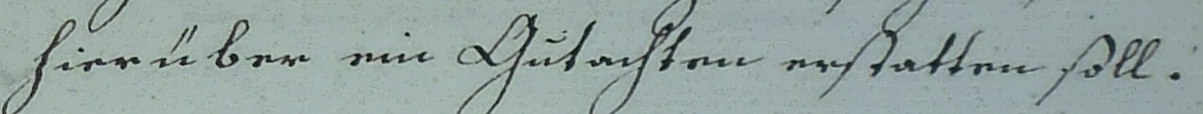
hierüber ein Gutachten erstatten soll.
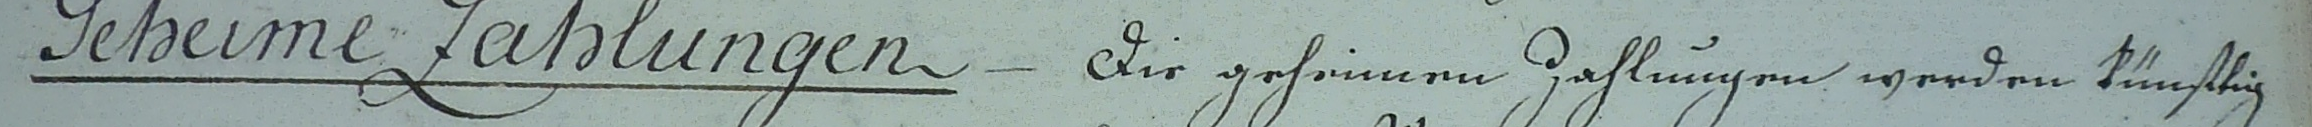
Geheime Zahlungen _ Die geheimen Zahlungen werden künftig
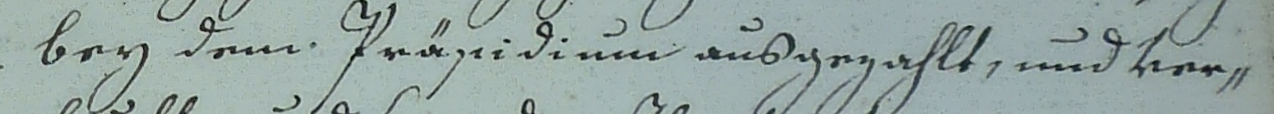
bey dem Präsidium ausgezahlt, und ver¬
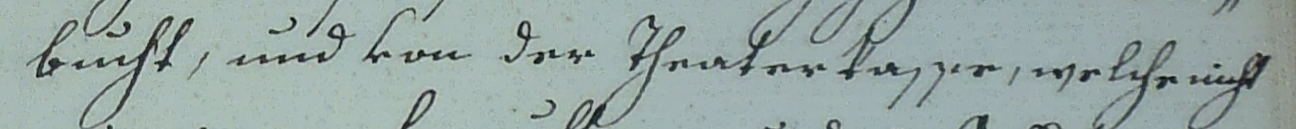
bucht, und von der Theaterkasse, welche nicht
